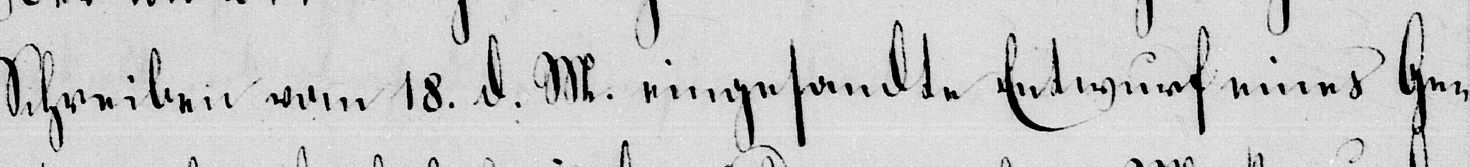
Schreiben vom 18. d. M. eingesandte Entwurf eines Ges¬
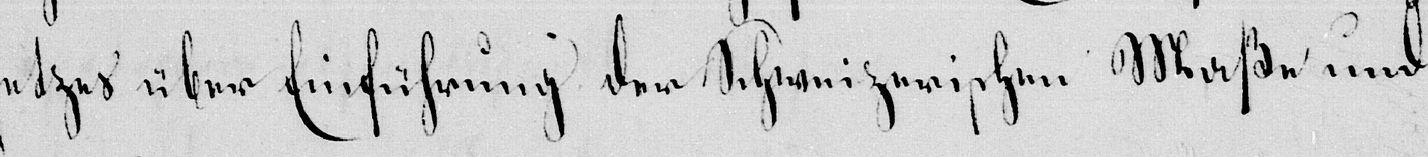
etzes über Einführung der Schweizerischen Maße und
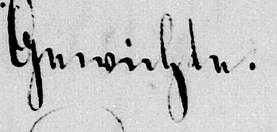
Gewichte.
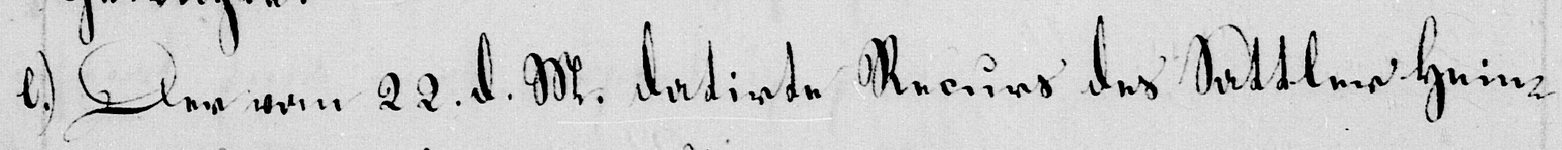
e.) Der vom 22. d. M. datirte Recurs des Sattler Hein¬
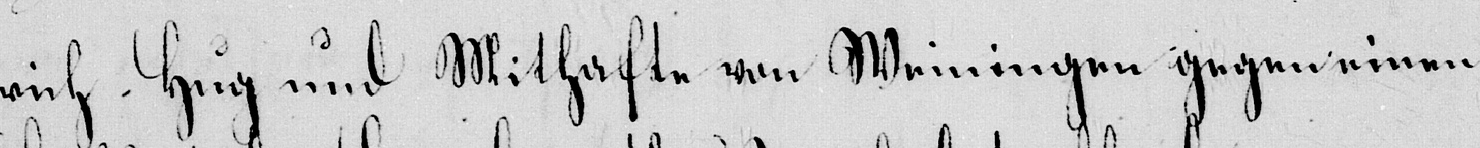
rich Hug und Mithafte von Weiningen gegen einen
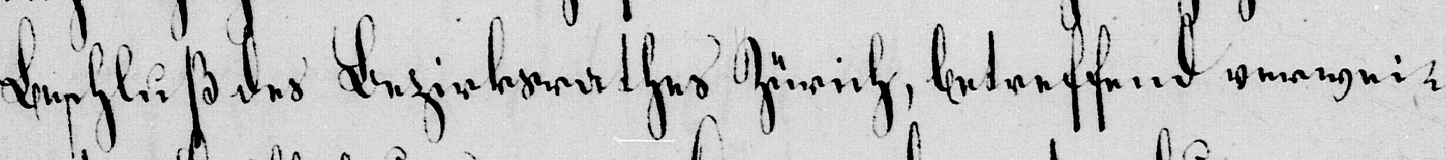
Beschluß des Bezirksrathes Zürich, betreffend verwei¬
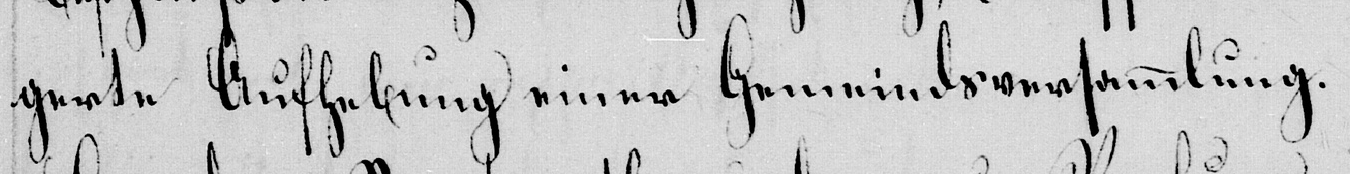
gerte Aufhebung einer Gemeindsversammlung.
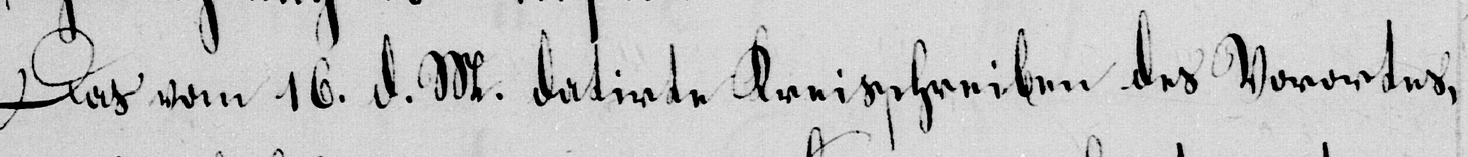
a.) Das vom 16. d. M. datirte Kreisschreiben des Vorortes,
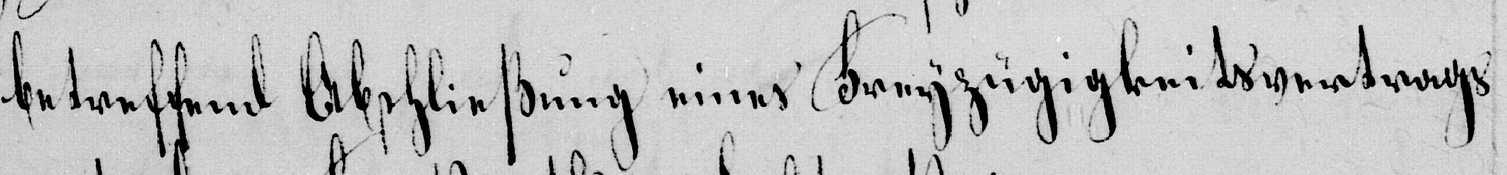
betreffend Abschließung eines Freyzügigkeitsvertrags
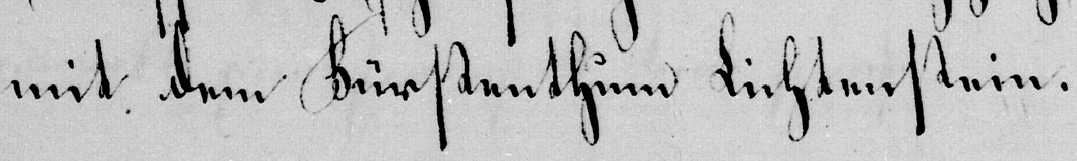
mit dem Fürstenthum Lichtenstein.
